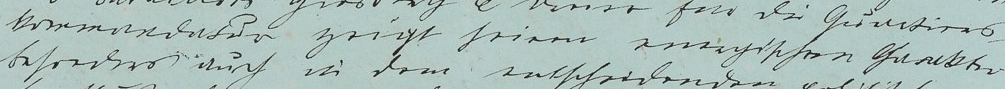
kommandatur zeigt seinen energischen Charakter
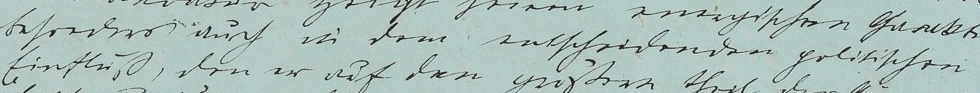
besonders auch in dem entscheidenden politischen
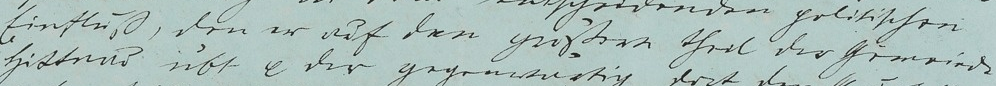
Einfluß, den er auf den größere Theil der Gemeinde
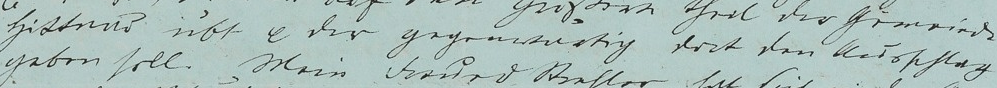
Hittnau übt & der gegenwärtig dort den Ausschlag
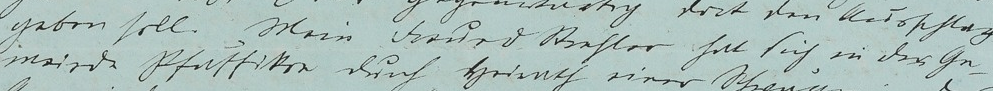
geben soll. Mein Freund Strehler hat sich in der Ge-
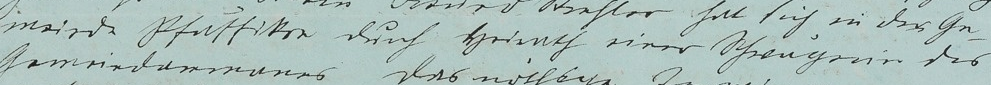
meinde Pfäffikon durch Heirath einer Schwägerin des
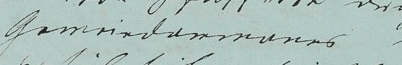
Gemeindammanns
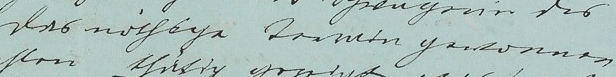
das nöthige Terrain gewonnen
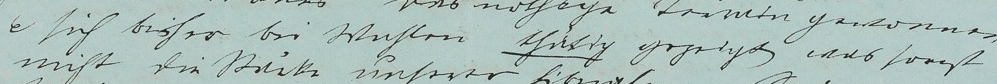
& sich bisher bei Wahlen thätig gezeigt, was sonst
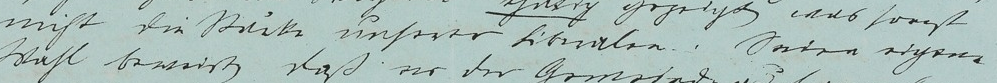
nicht die Stärke unserer Liberalen. Seine eigene
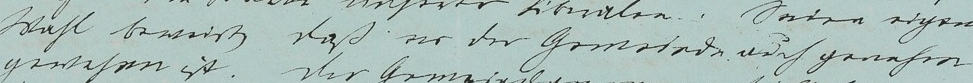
Wahl beweist daß er der Gemeinde auch genehm
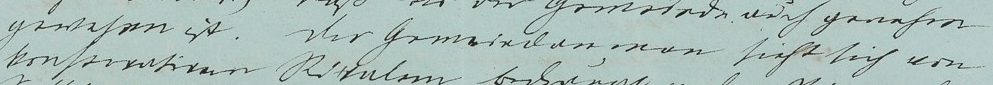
gewesen ist. Der Gemeindamman sieht sich von
